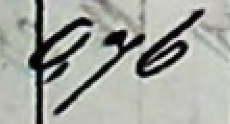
0,76
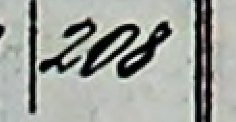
208
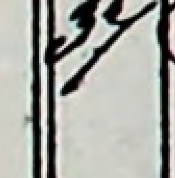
37
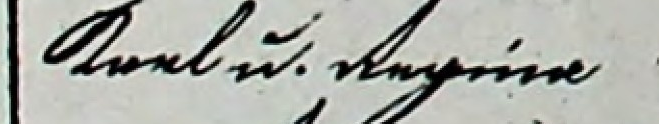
Karl u. Regina
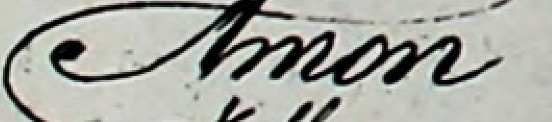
Amon
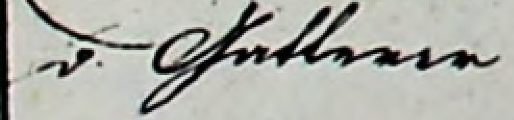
v. Gatterer
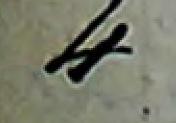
4
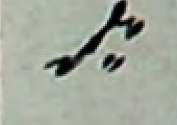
do
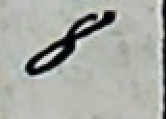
8
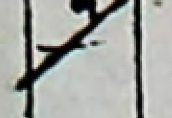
7
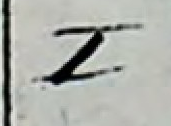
I
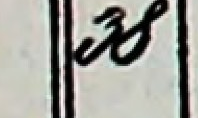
38
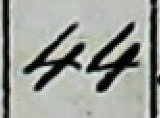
44
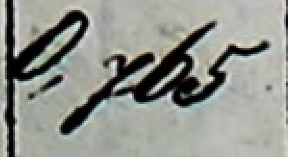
0,765
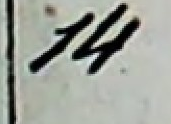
14
